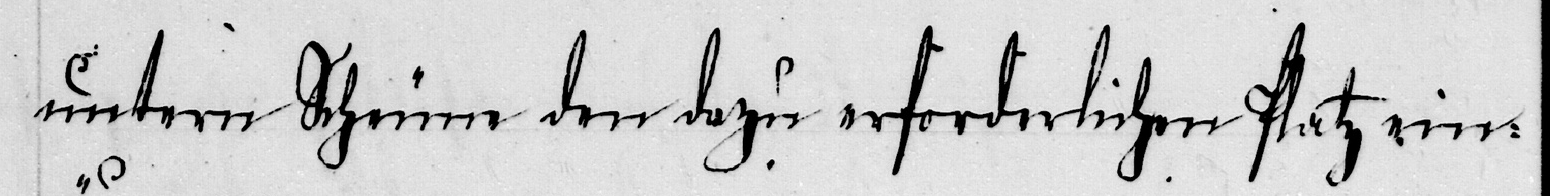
untern Scheune den dazu erforderlichen Platz ein¬
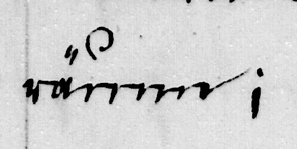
räume;
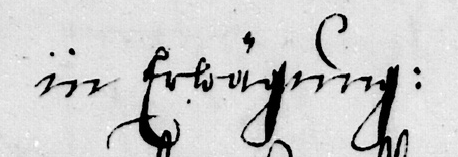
in Erwägung:
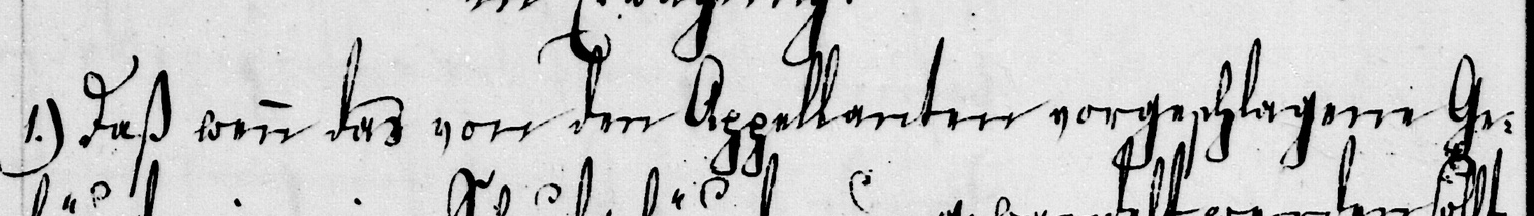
1.) Daß wenn das von den Appallanten vorgeschlagene Ge¬
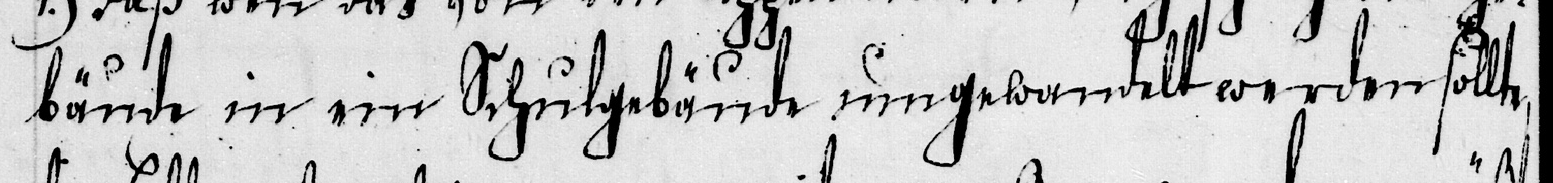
bäude in ein Schulgebäude umgewandelt werden sollt¬
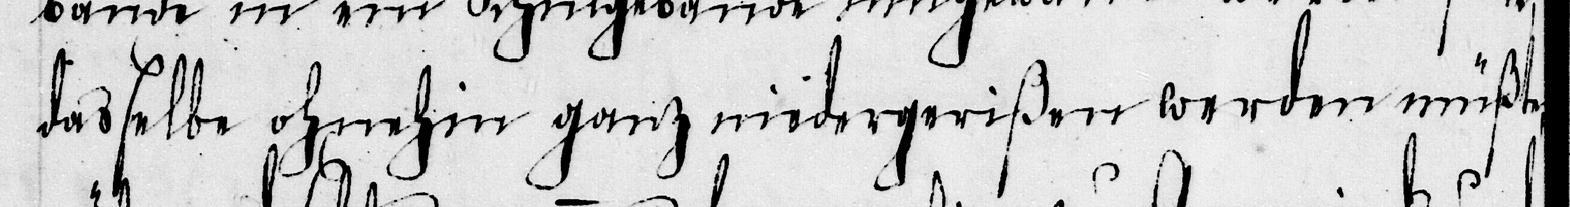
dasselbe ohnehin ganz niedergerißen werden müßte,
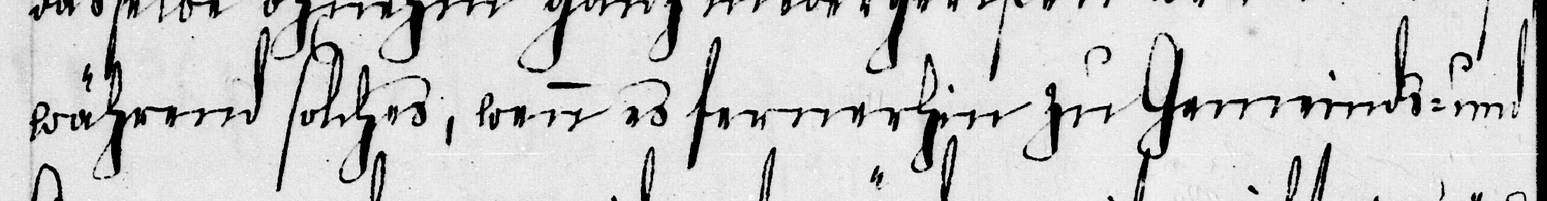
während solches, wenn es fernerhin zu Gemeinds- und
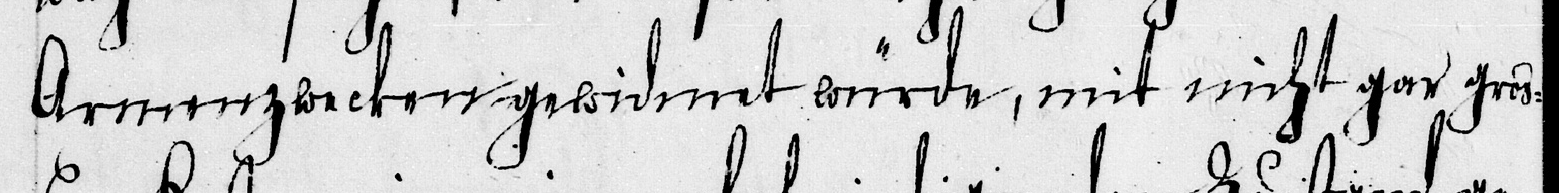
Armenzwecken gewidmet würde, mit nicht gar groß¬
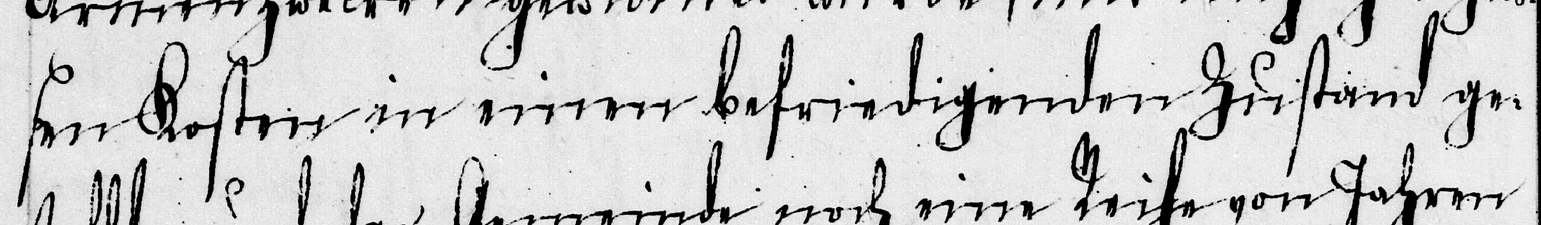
en Kosten in einen befriedigenden Zustand ge¬
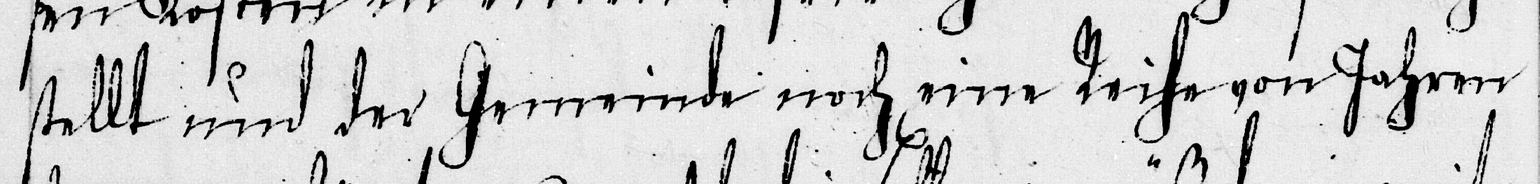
stellt und der Gemeinde noch eine Reihe von Jahren
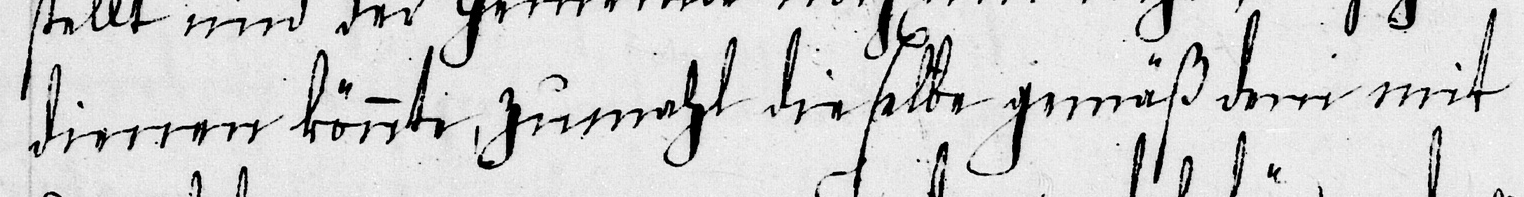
dienen könnte, zumahl dieselbe gemäß dem mit
